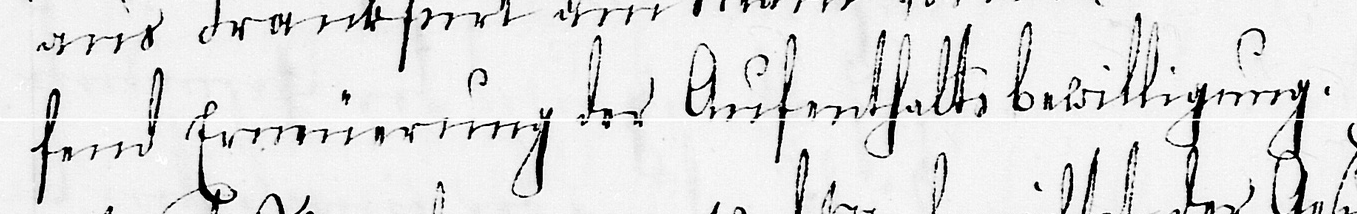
fend Erneuerung der Aufenthaltsbewilligung.
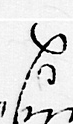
5.
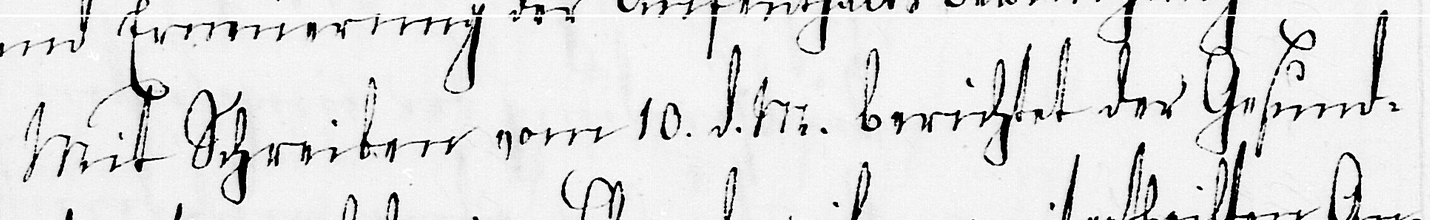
Mit Schreiben vom 10. d. M. berichtet der Gesund¬
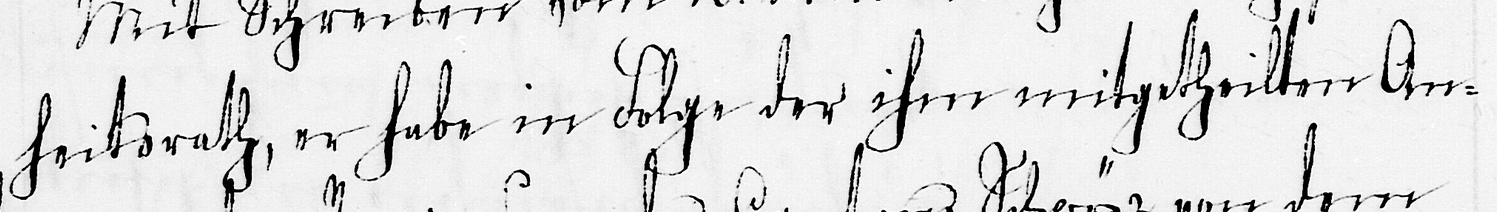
heitsrath, er habe in Folge der ihm mitgetheilten An¬
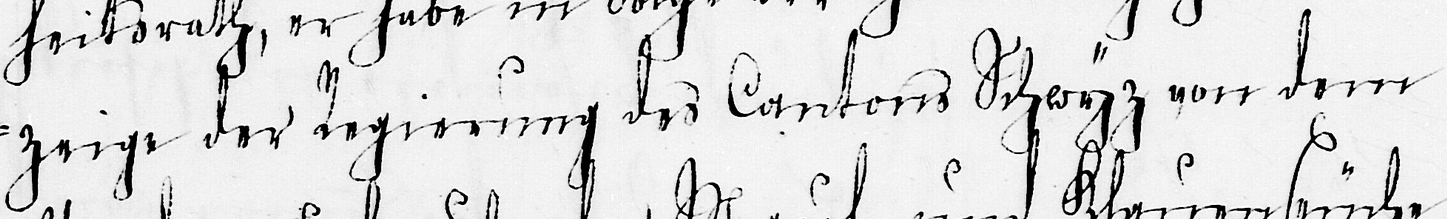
zeige der Regierung des Cantons Schwyz von dem
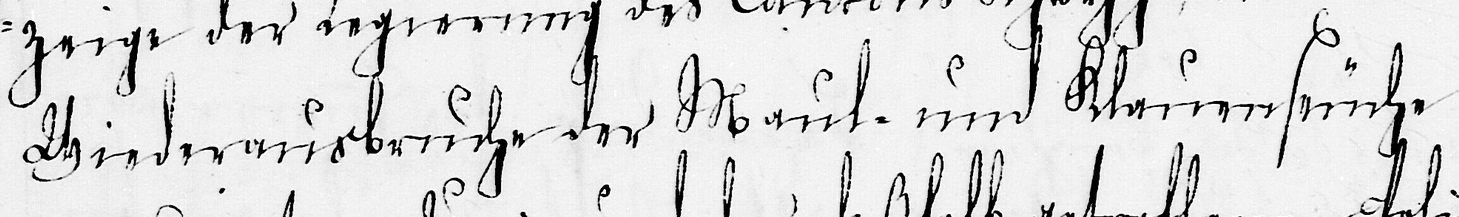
Wiederausbruche der Maul- und Klauenseuche
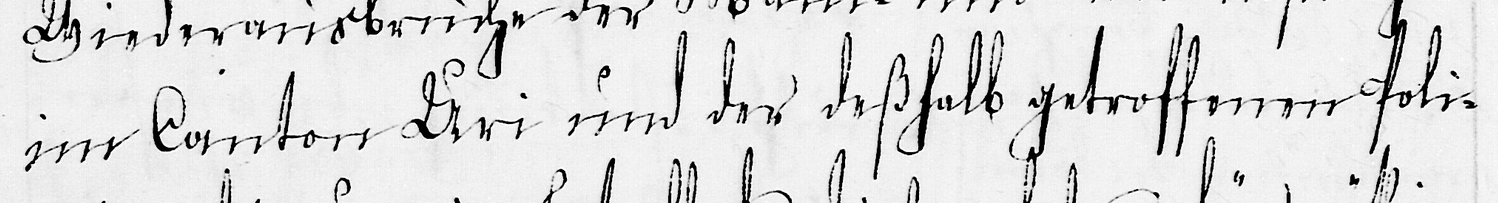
im Canton Uri und der deßhalb getroffenen Poli¬
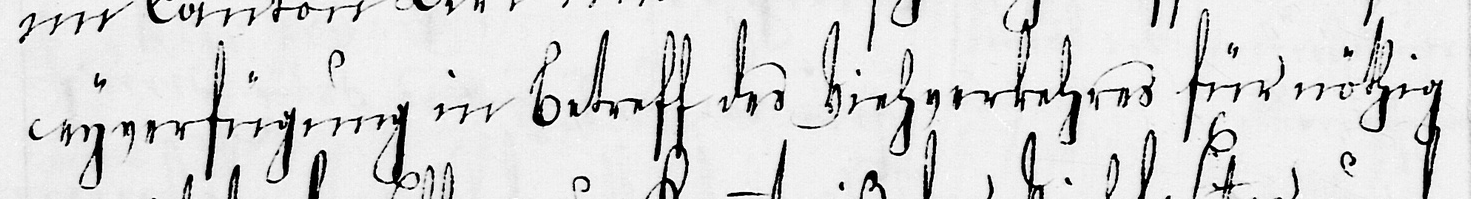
ceyverfügung in Betreff des Viehverkehres für nöthig
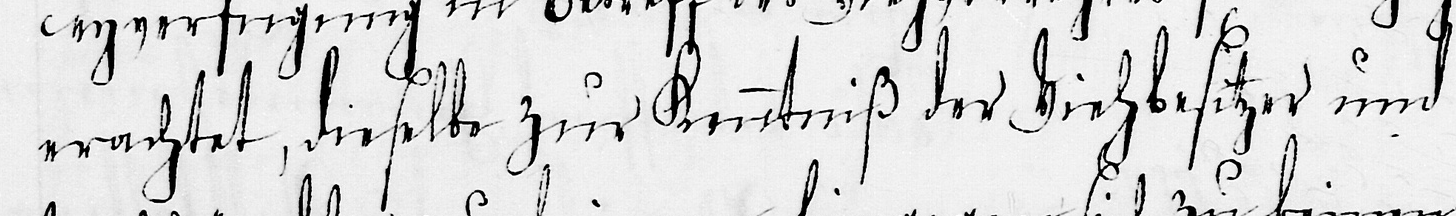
erachtet, dieselbe zur Kenntniß der Viehbesitzer und
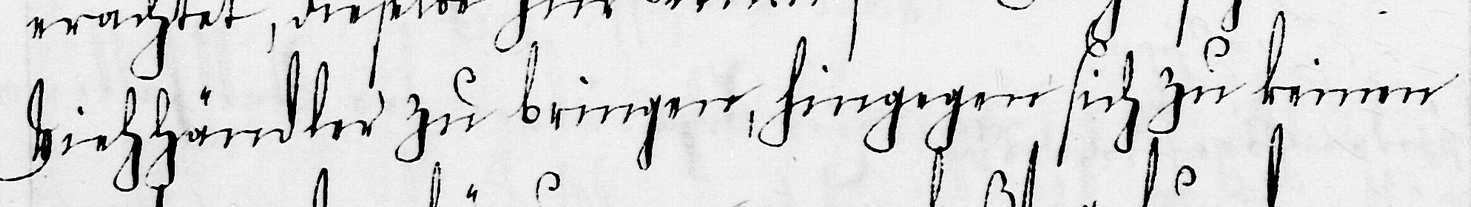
Viehhändler zu bringen, hingegen sich zu keinen
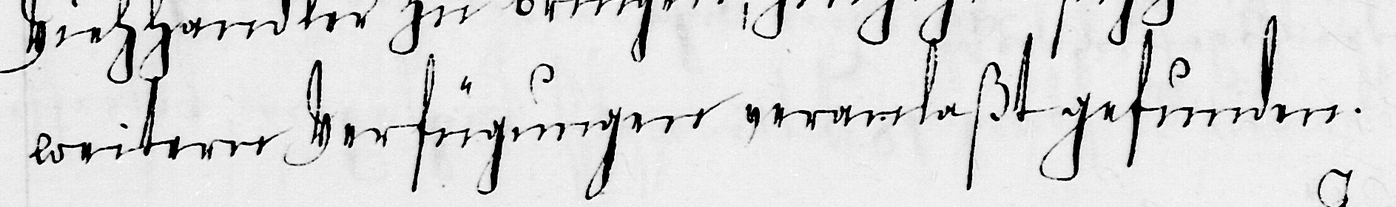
weitern Verfügungen veranlaßt gefunden.
